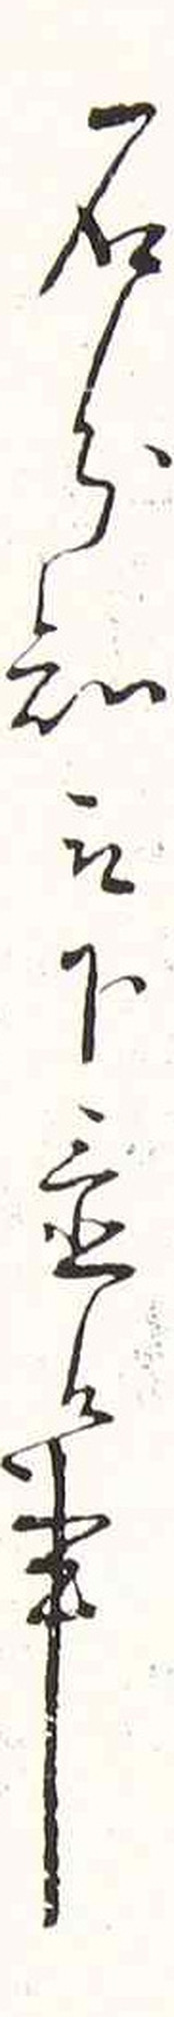石分知被下置候事
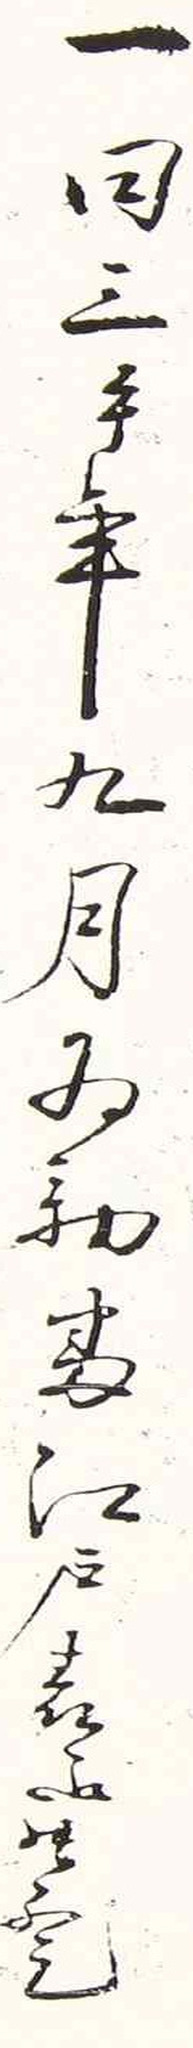一同三午年九月為勤番江戸表江罷登
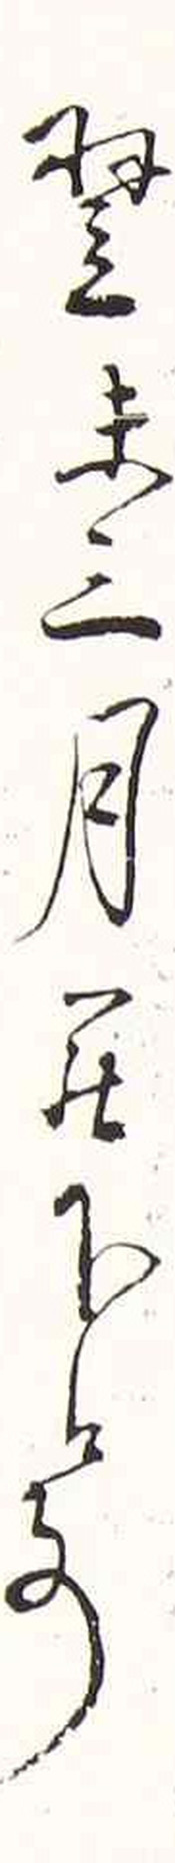翌未三月罷下候事
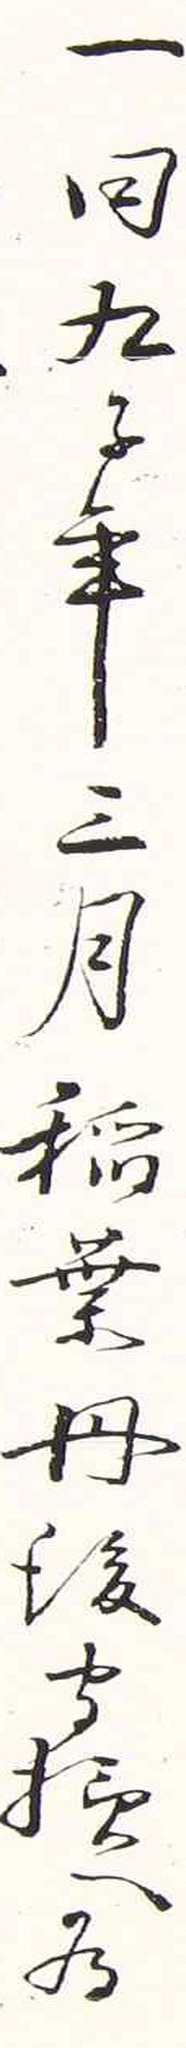一同九子年三月稲葉丹後守様へ為
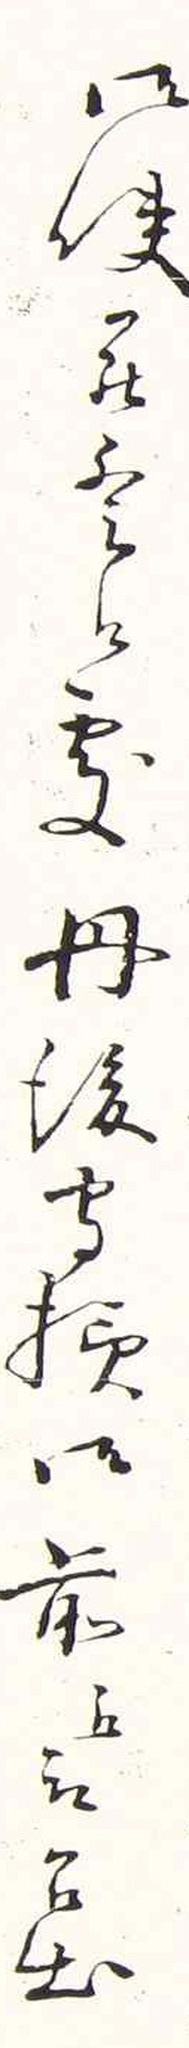御使罷登候処丹後守様御前江被召出
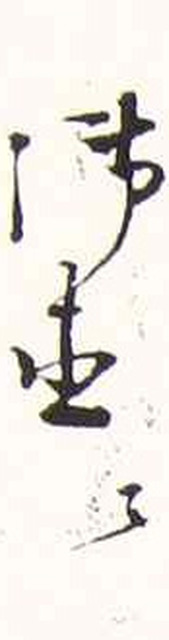御直ニ

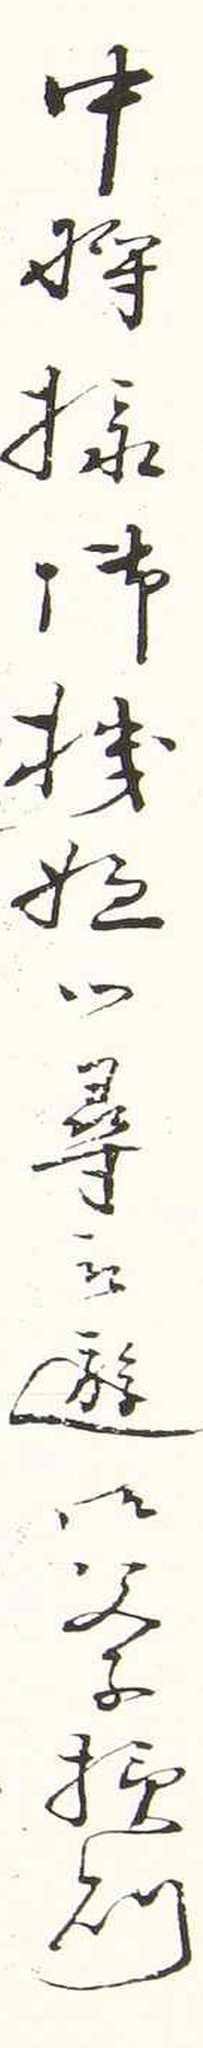中将様御機嫌御尋被遊御父子様則
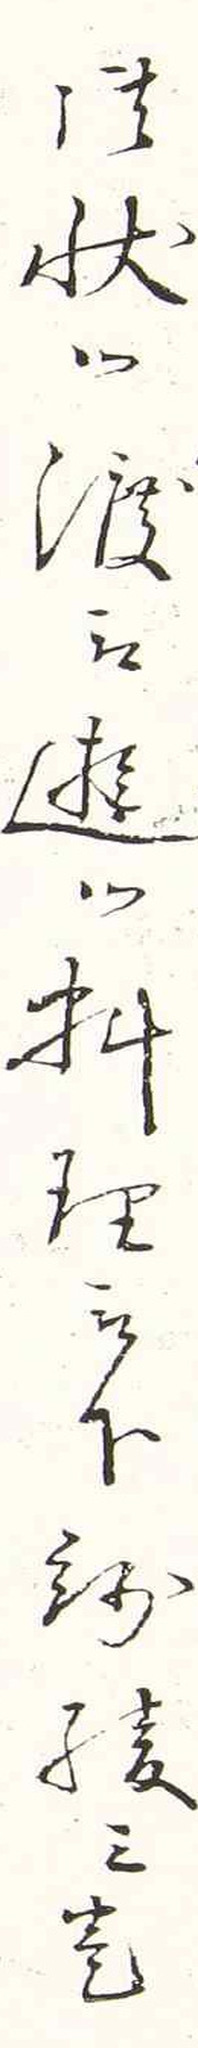御状御渡被遊御料理被下紗綾三巻
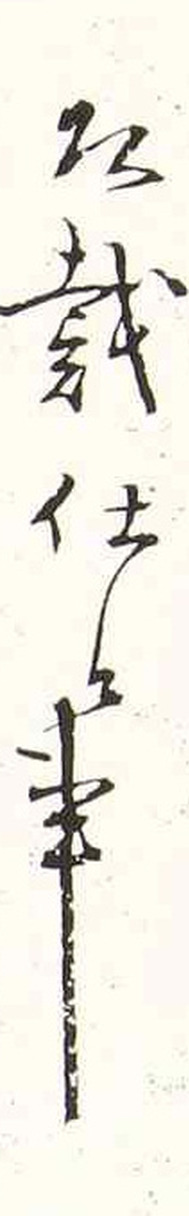頂戴仕候事
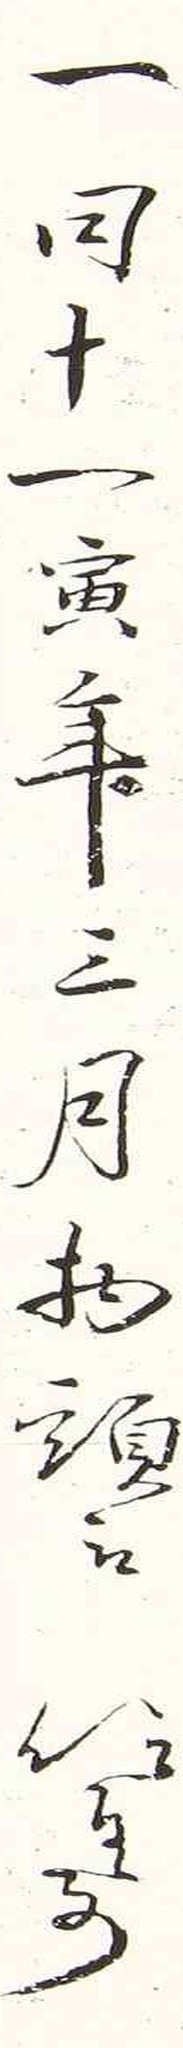一同十一寅年三月物頭被仰付候事
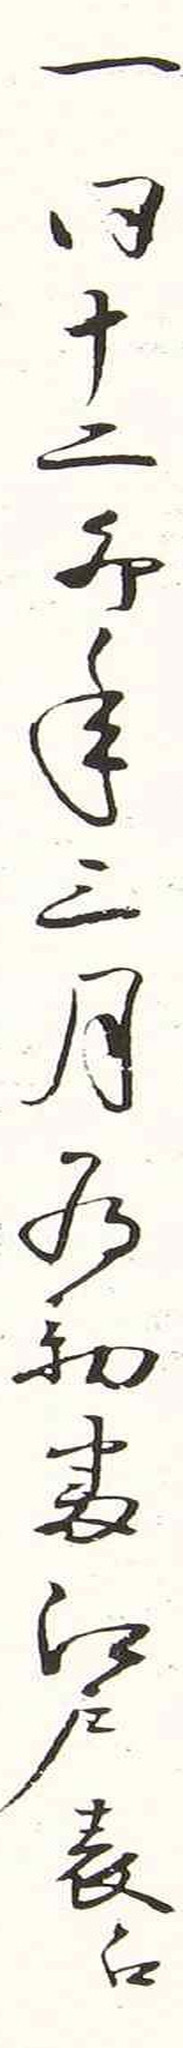一同十二卯年三月為勤番江戸表江
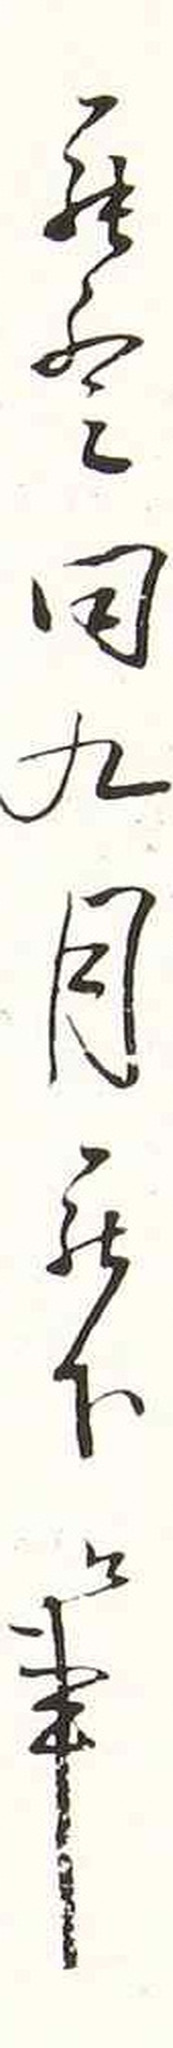罷登同九月罷下候事
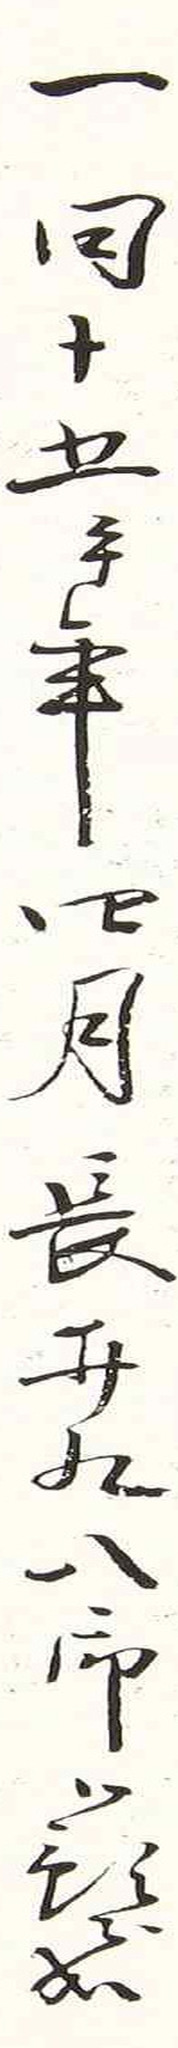一同十五午年四月長井九八郎御預被成
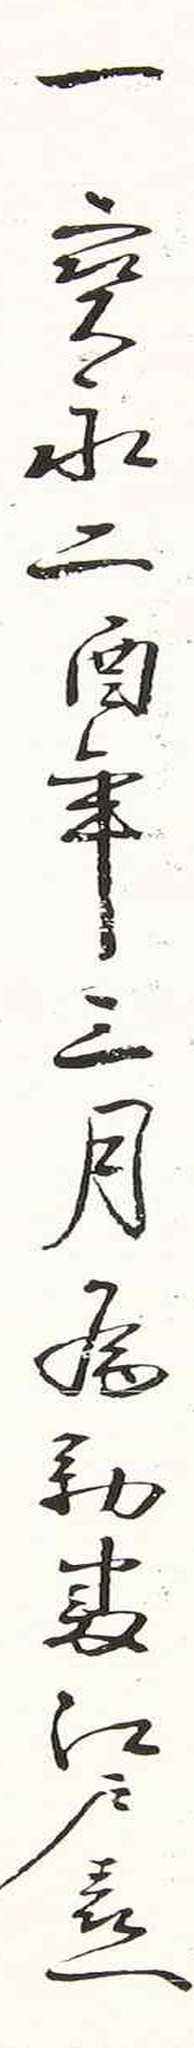一宝永二酉年三月為勤番江戸表へ
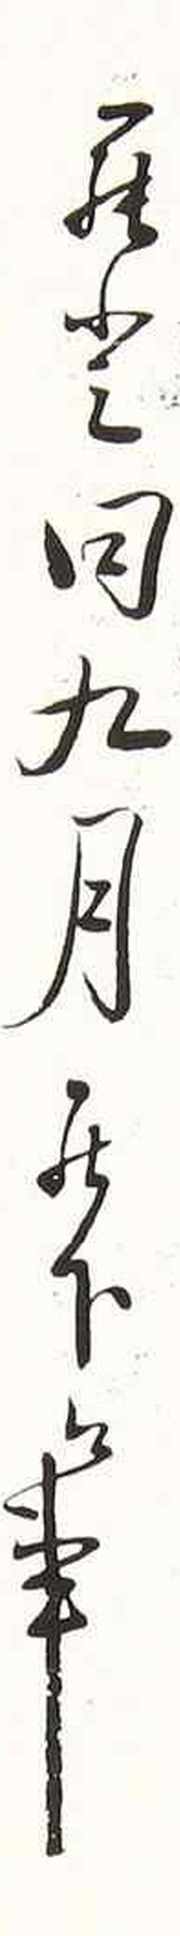罷登同九月罷下候事
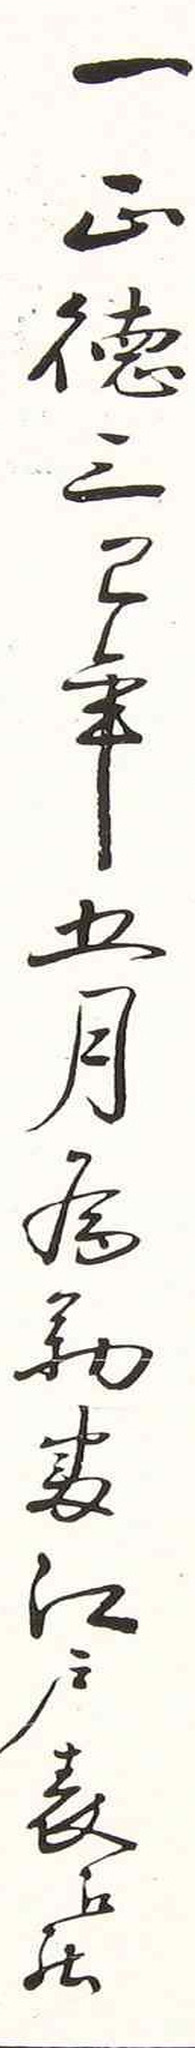一正徳三巳年五月為勤番江戸表江罷
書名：諸士系譜　巻之357　す之部7
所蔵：会津若松市立会津図書館
